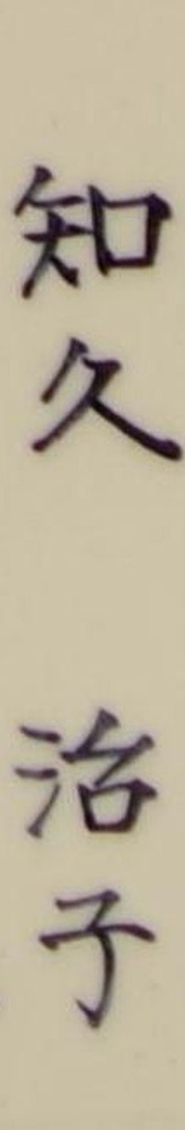知久治子
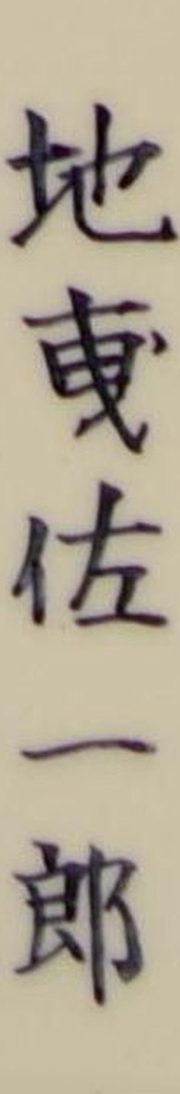地曳佐一郎
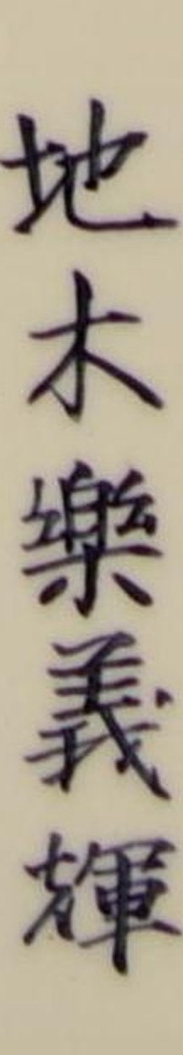地木楽義輝
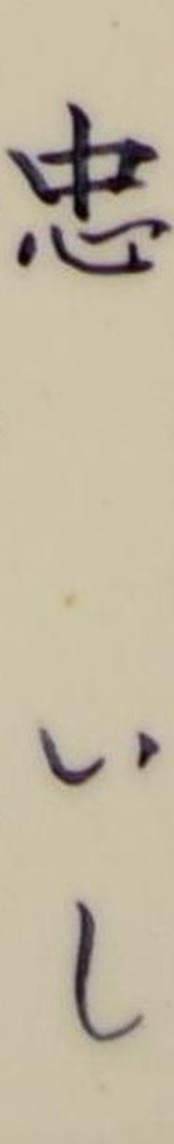忠いし
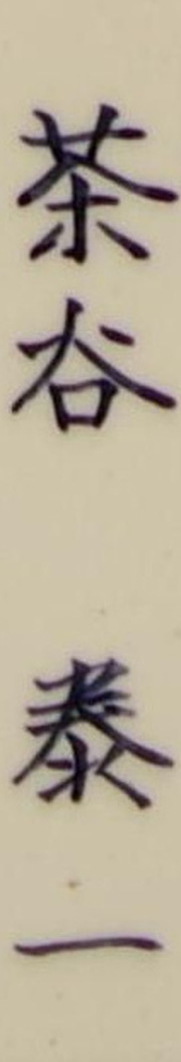茶谷泰一
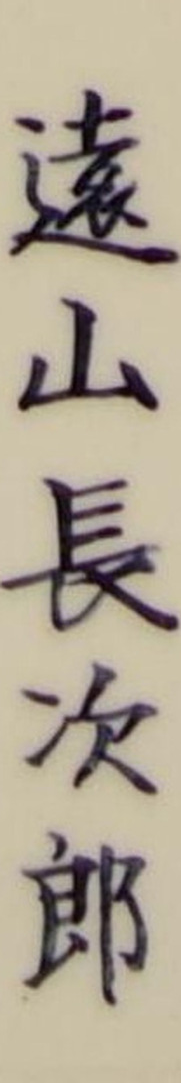遠山長次郎
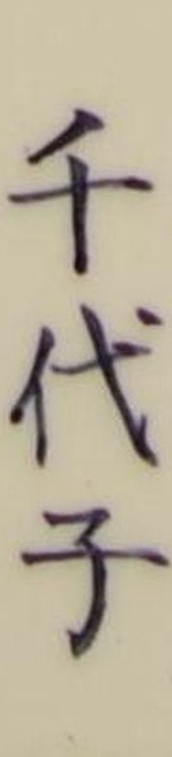千代子
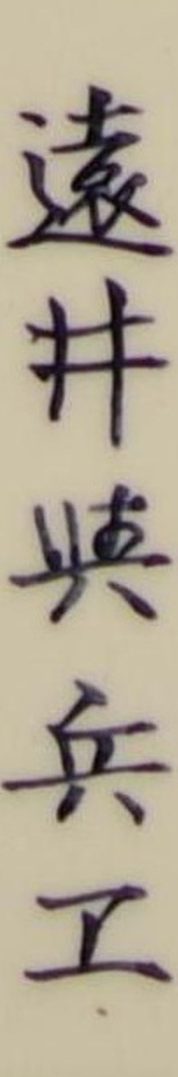遠井与兵ヱ
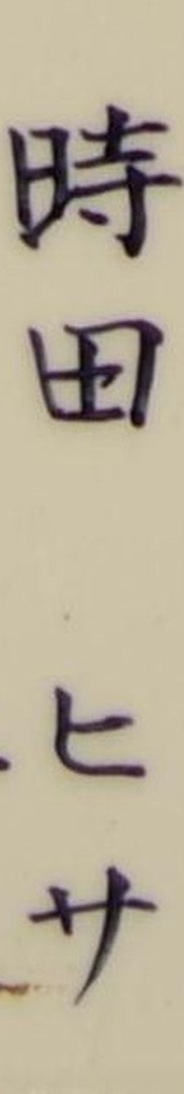時田ヒサ
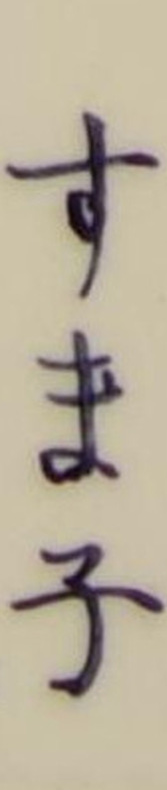すま子
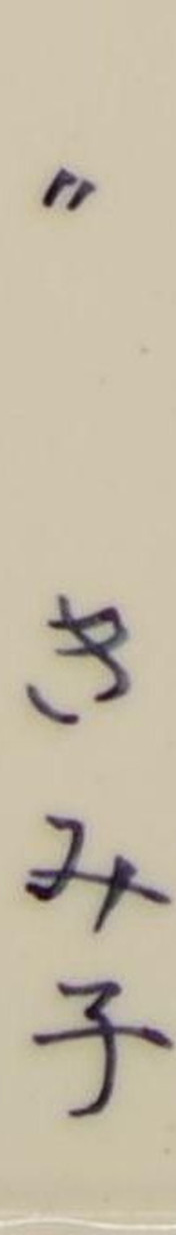きみ子
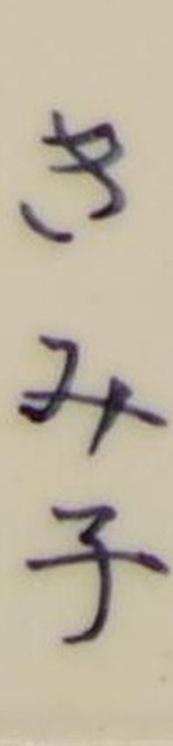きみ子
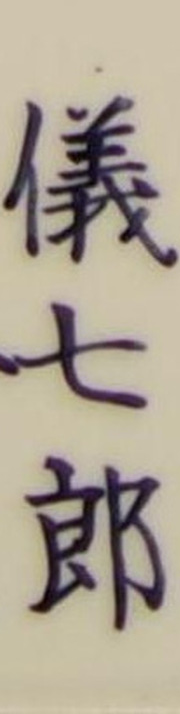儀七郎

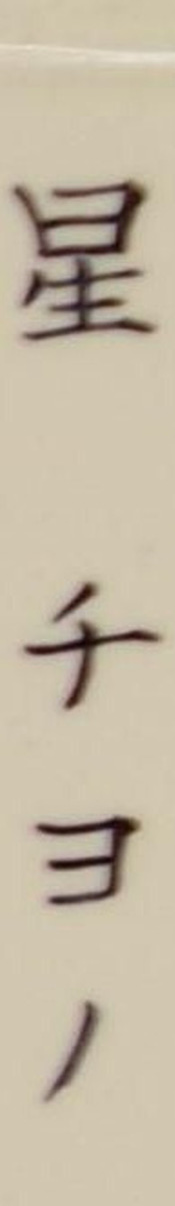星チヨノ
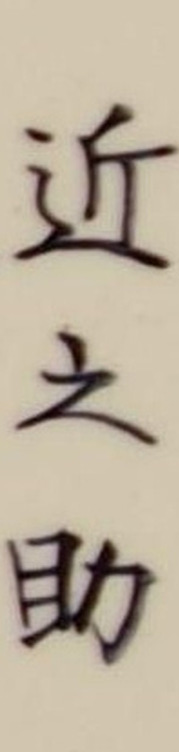近之助
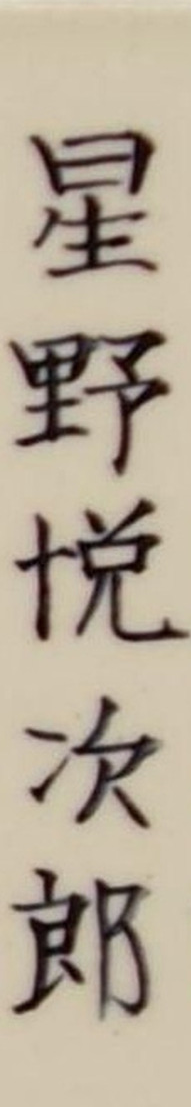星野悦次郎
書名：A~D
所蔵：koyasan kongobuji
